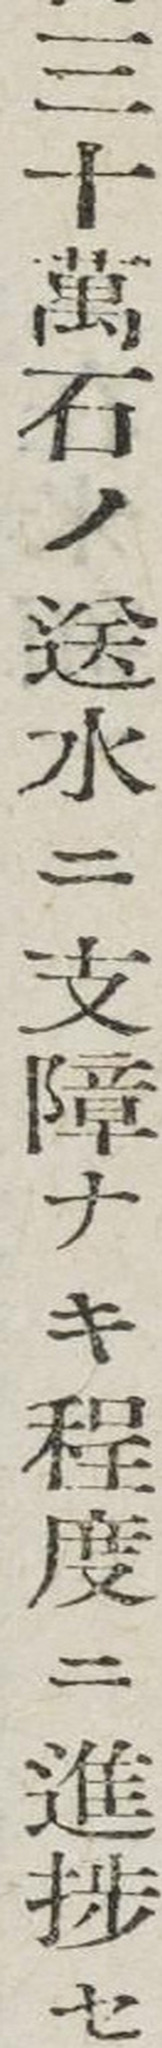約三十万石ノ送水ニ支障ナキ程度ニ進捗セリ
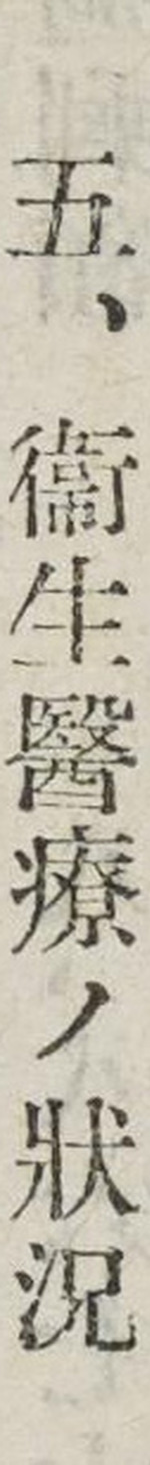五、衛生医療ノ状況
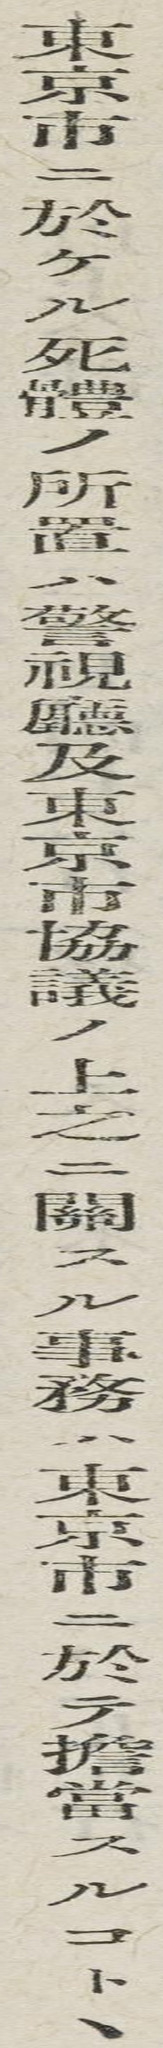東京市ニ於ケル死体ノ所置ハ警視庁及東京市協議ノ上之ニ関スル事務ハ東京市ニ於テ担当スルコトヽ
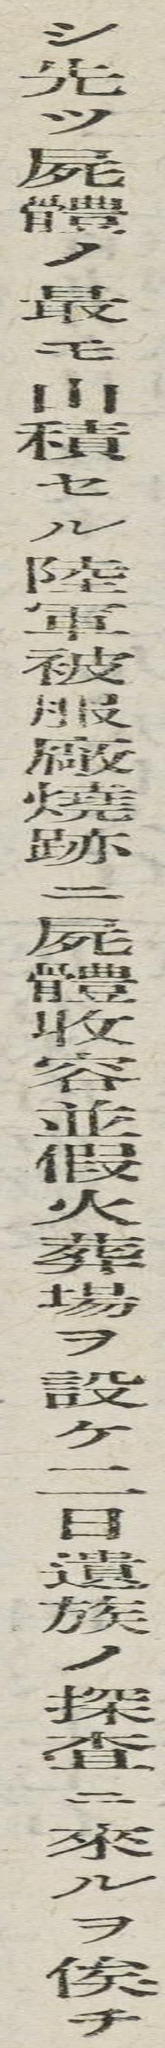シ先ツ屍体ノ最モ山積セル陸軍被服廠焼跡ニ屍体収容並仮火葬場ヲ設ケ二日遺族ノ探査ニ来ルヲ俟チ
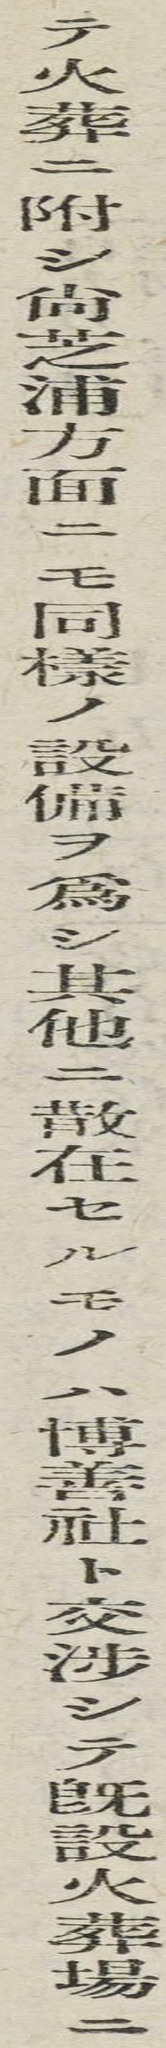テ火葬ニ附シ尚芝浦方面ニモ同様ノ設備ヲ為シ其他ニ散在セルモノハ博善社ト交渉シテ既設火葬場ニ
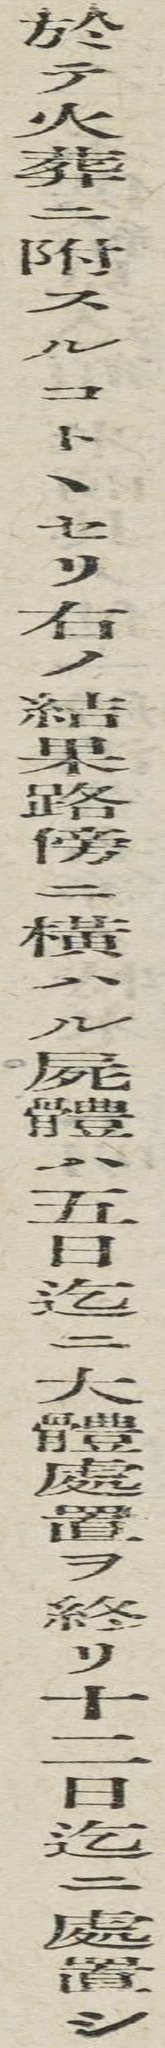於テ火葬ニ附スルコトヽセリ右ノ結果路傍ニ横ハル屍体ハ五日迄ニ大体処置ヲ終リ十二日迄ニ処置シ
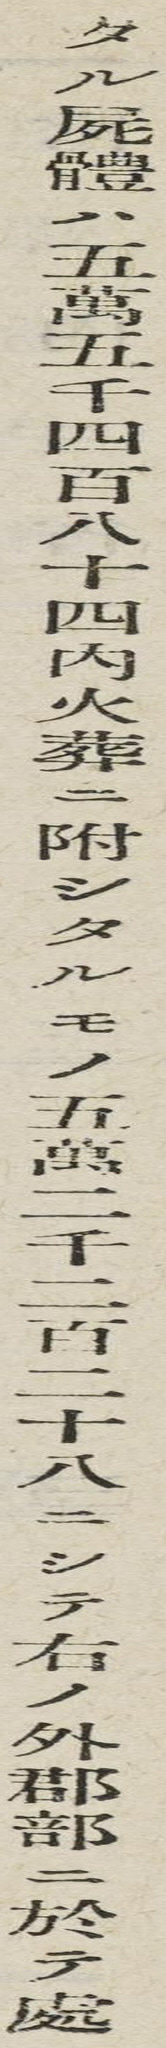タル屍体ハ五万五千四百八十四内火葬ニ附シタルモノ五万二千二百二十八ニシテ右ノ外郡部ニ於テ処
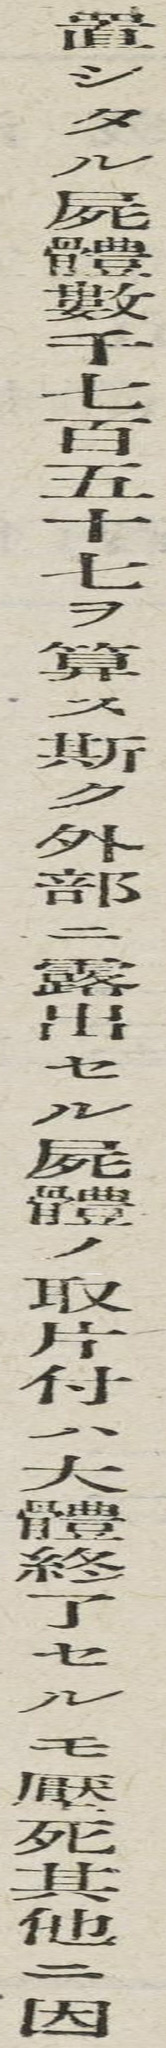置シタル屍体数千七百五十七ヲ算ス斯ク外部ニ露出セル屍体ノ取片付ハ大体終了セルモ圧死其他ニ因
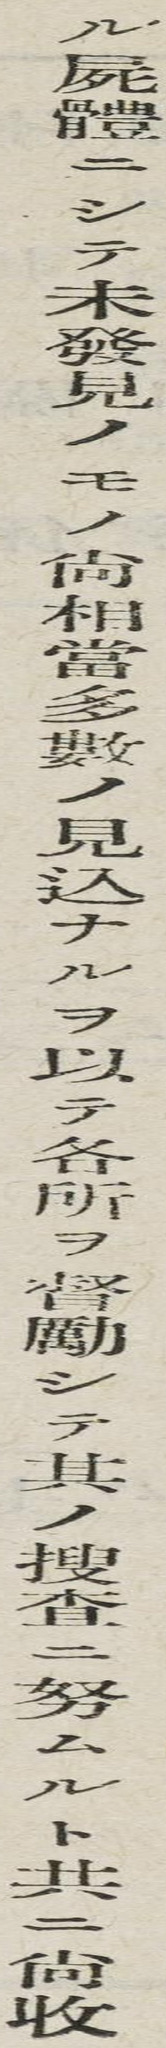ル屍体ニシテ未発見ノモノ尚相当多数ノ見込ナルヲ以テ各所ヲ督励シテ其ノ捜査ニ努ムルト共ニ尚収
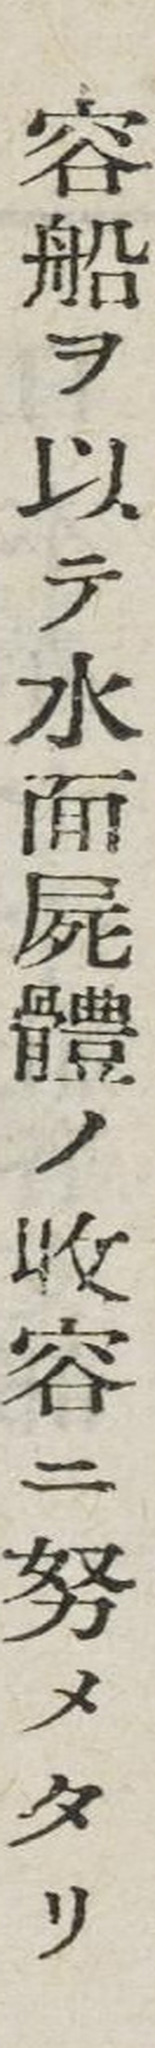容船ヲ以テ水面屍体ノ収容ニ努メタリ
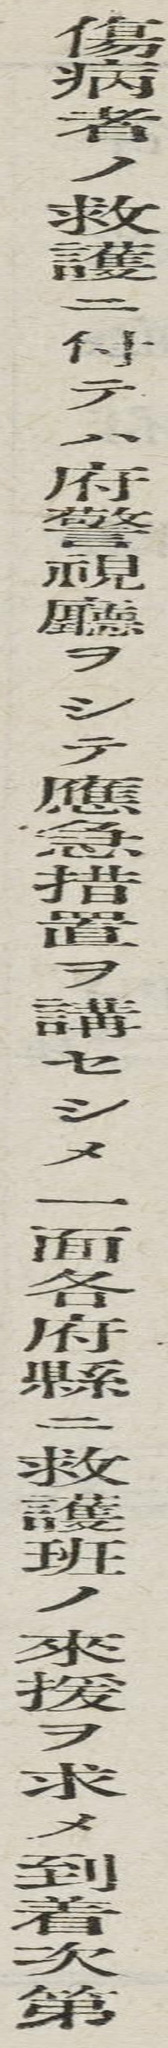傷病者ノ救護ニ付テハ府警視庁ヲシテ応急措置ヲ講セシメ一面各府県ニ救護班ノ来援ヲ求メ到着次第
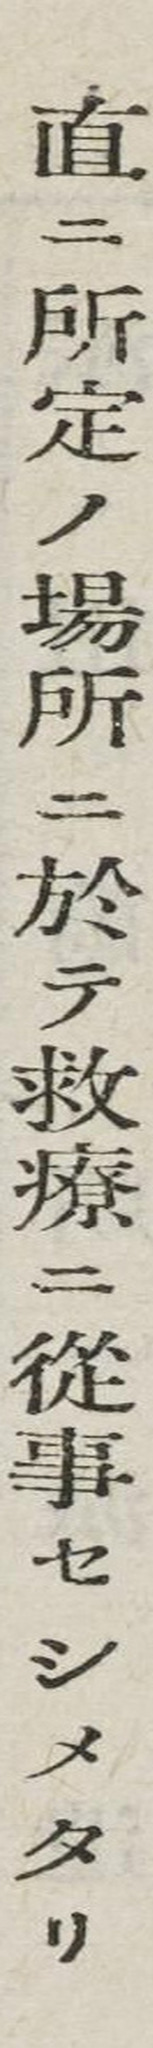直ニ所定ノ場所ニ於テ救療ニ従事セシメタリ
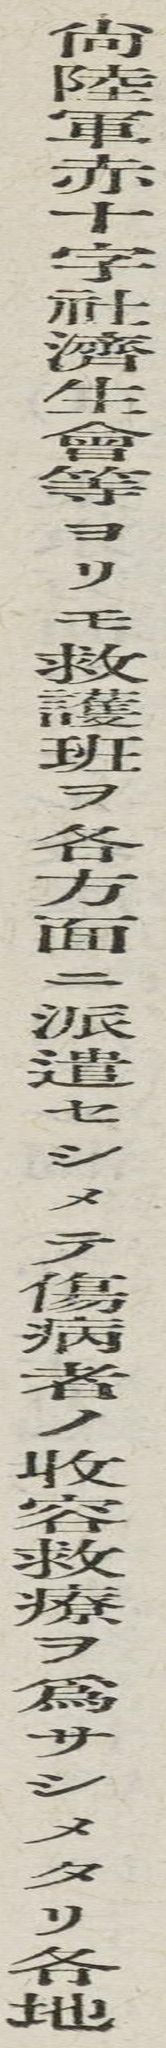尚陸軍赤十字社済生会等ヨリモ救護班ヲ各方面ニ派遣セシメテ傷病者ノ収容救療ヲ為サシメタリ各地
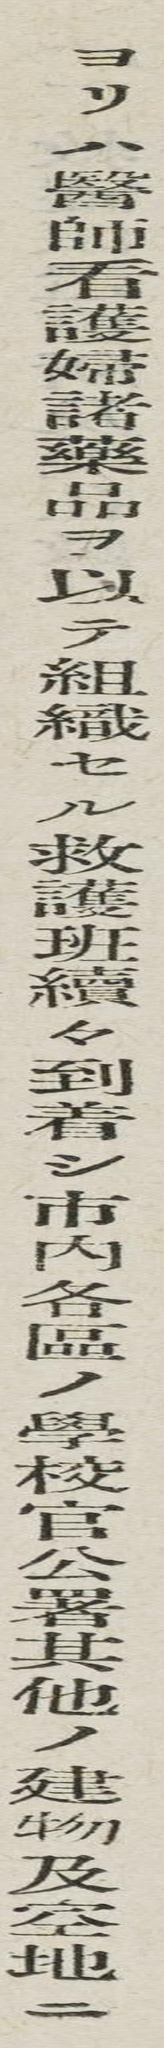ヨリハ医師看護婦諸薬品ヲ以テ組織セル救護班続々到着シ市内各区ノ学校官公署其他ノ建物及空地ニ
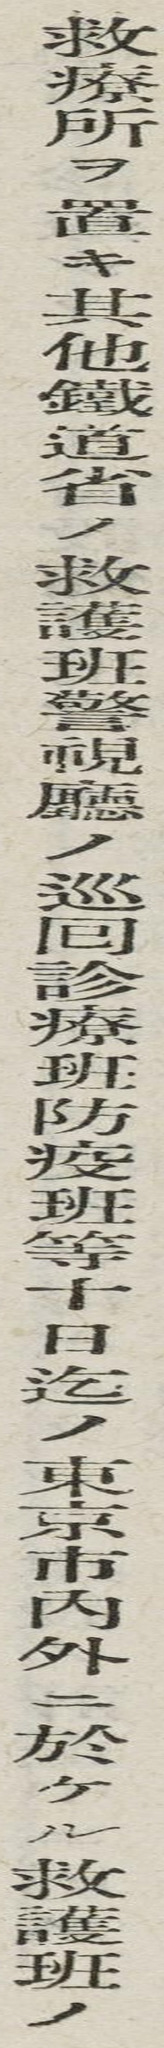救療所ヲ置キ其他鉄道省ノ救護班警視庁ノ巡廻診療班防疫班等十日迄ノ東京市内外ニ於ケル救護班ノ
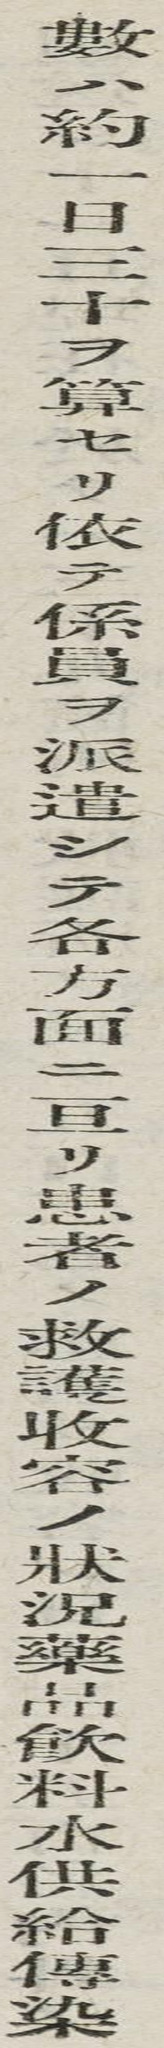数ハ約一日三十ヲ算セリ依テ係員ヲ派遣シテ各方面ニ亘リ患者ノ救護収容ノ状況薬品飲料水供給伝染
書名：震災被害状況並救護施設概要
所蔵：東京大学地震研究所図書室 Earthquake Research Institute Library, The University of Tokyo, JAPAN
